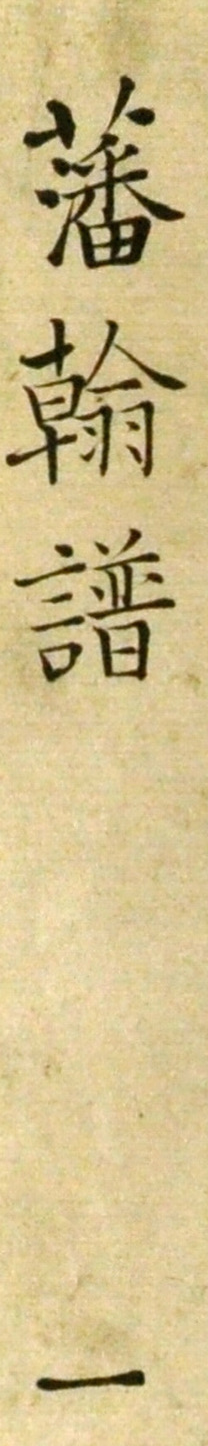藩翰譜一

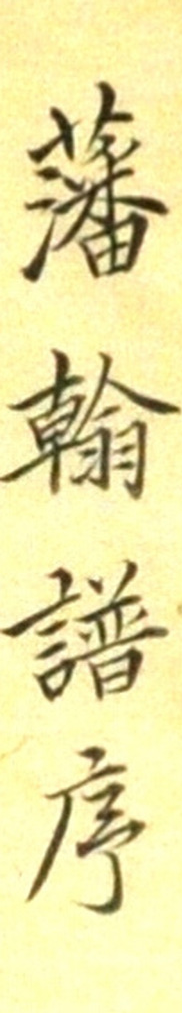藩翰譜序
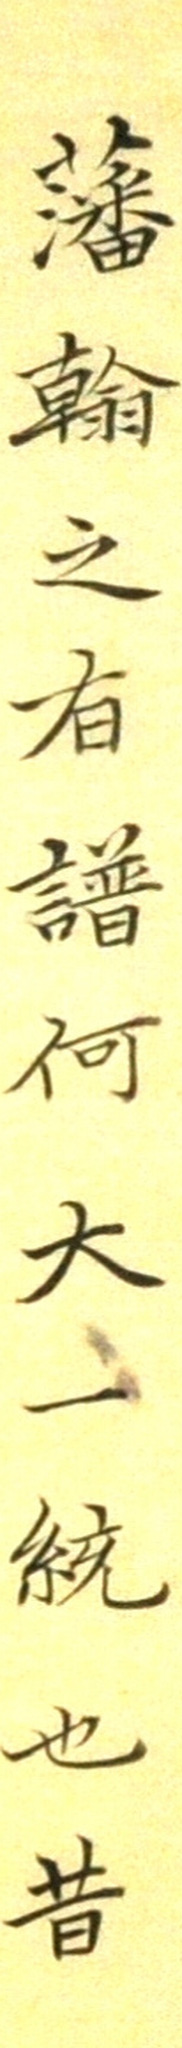藩翰之有譜何大一統也昔
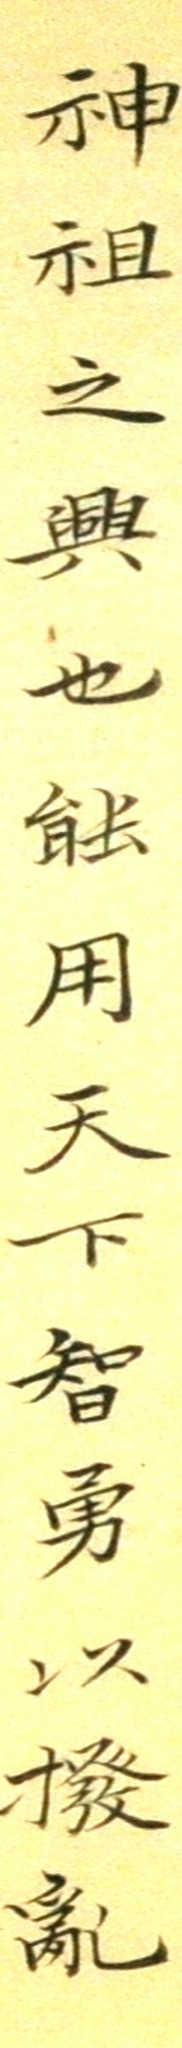神祖之興也能用天下智勇以撥乱
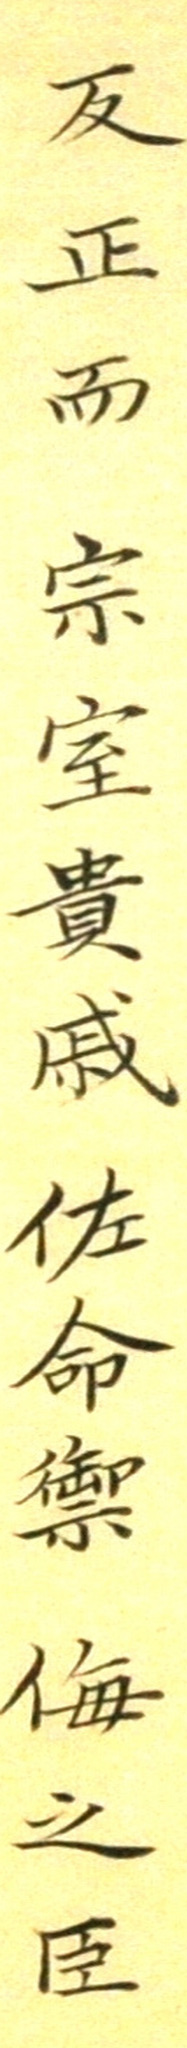反正而宗室貴戚佐命禦侮之臣
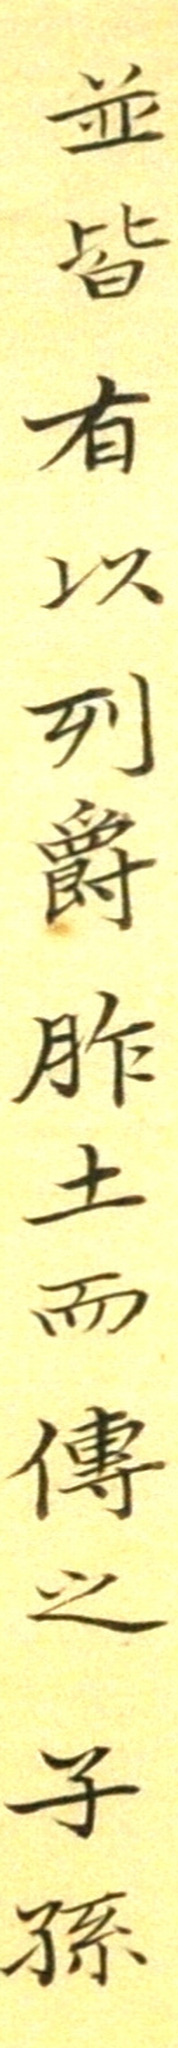並皆有以列爵胙土而伝之子孫
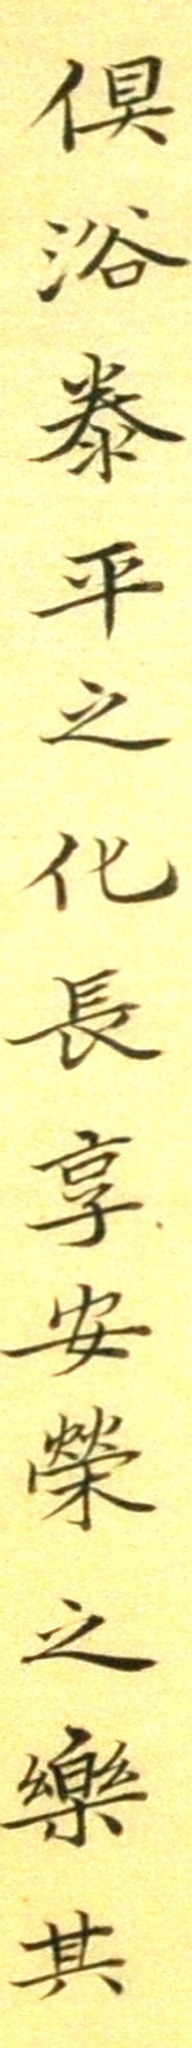倶浴泰平之化長享安栄之楽其
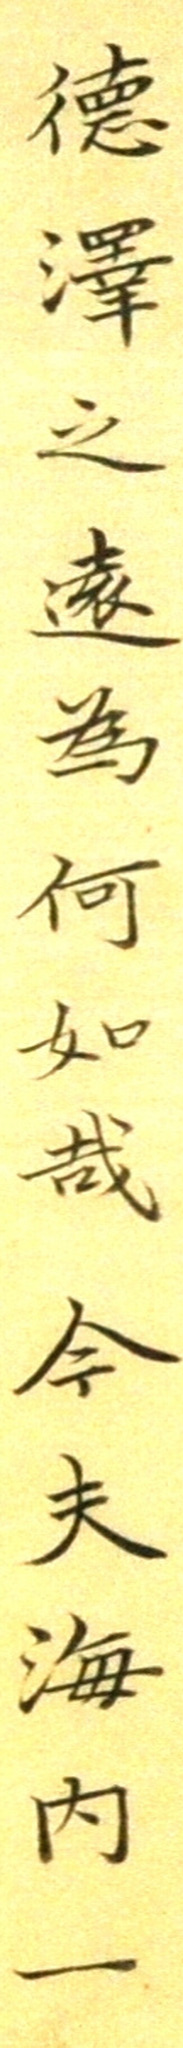徳沢之遠為何如哉今夫海内一
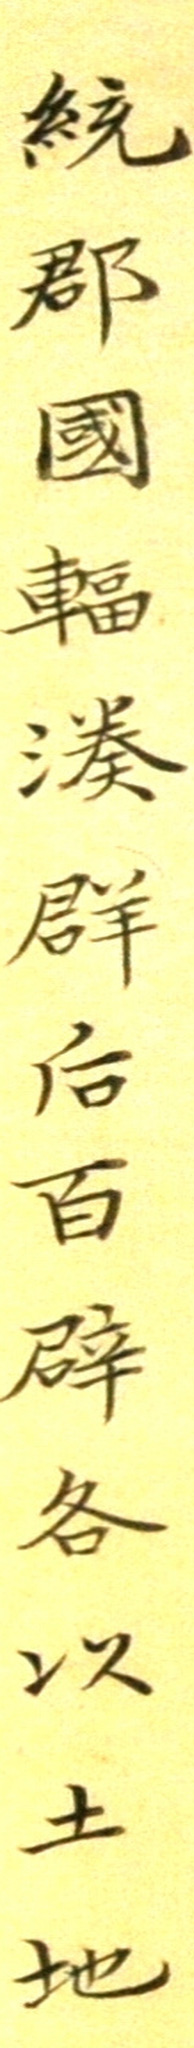統郡国輻湊群后百辟各以土地

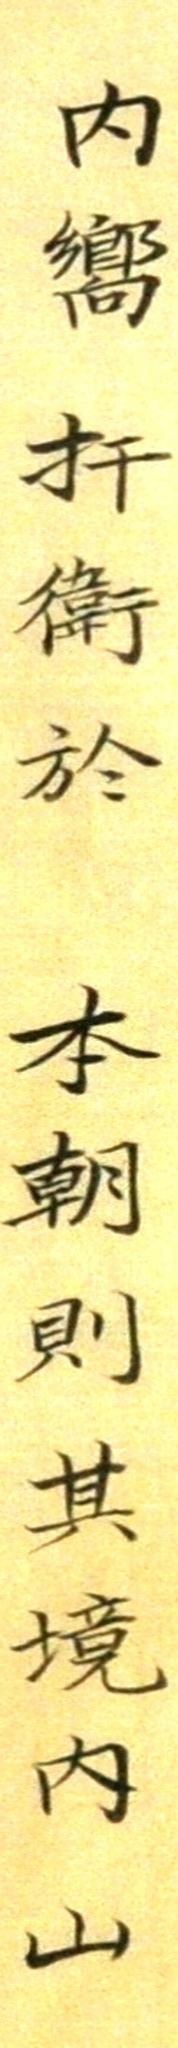内嚮扞衛於本朝則其境内山
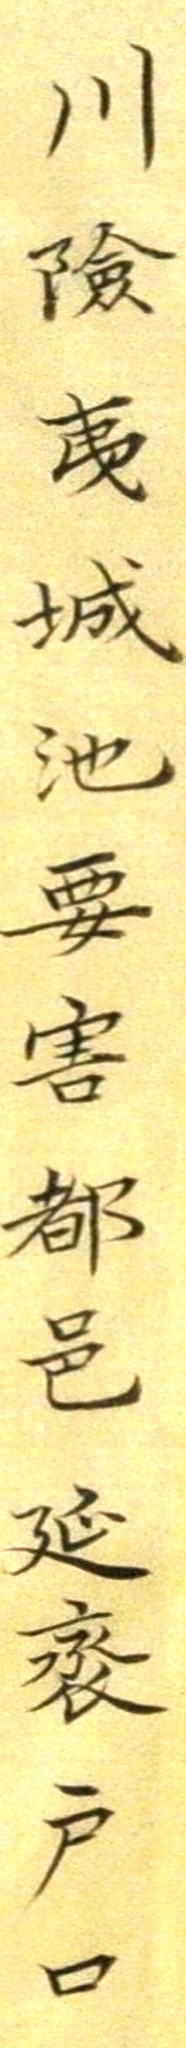川険夷城池要害都邑延袤戸口
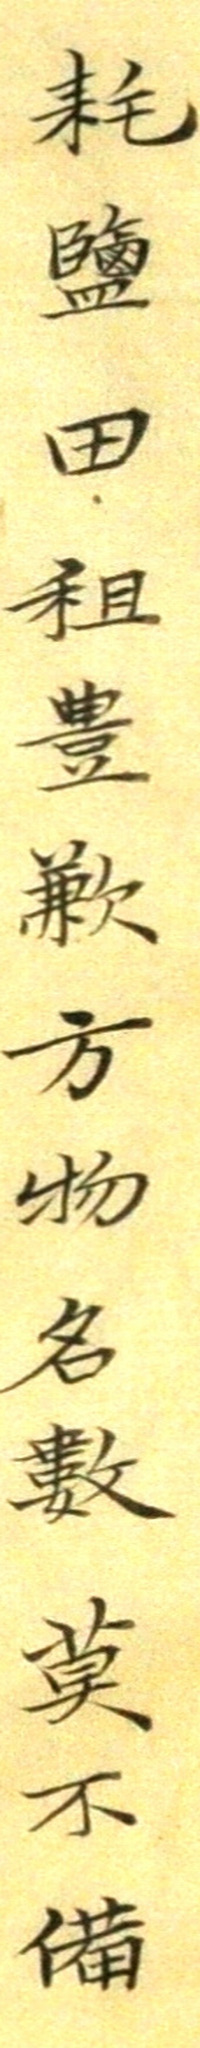耗塩田租豊歉方物名数莫不備
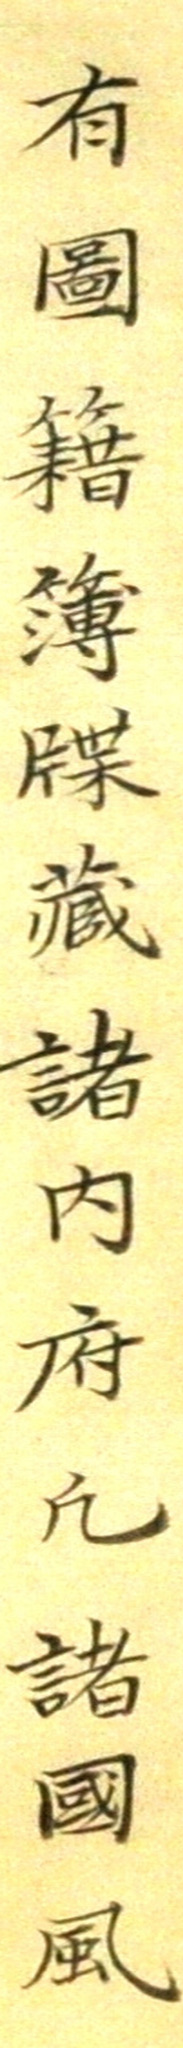有図籍簿牒蔵諸内府凡諸国風
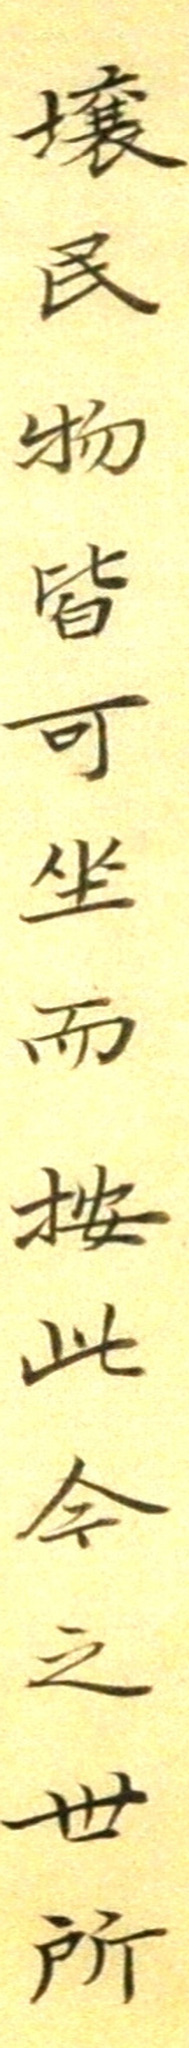壌民物皆可坐而按此今之世所
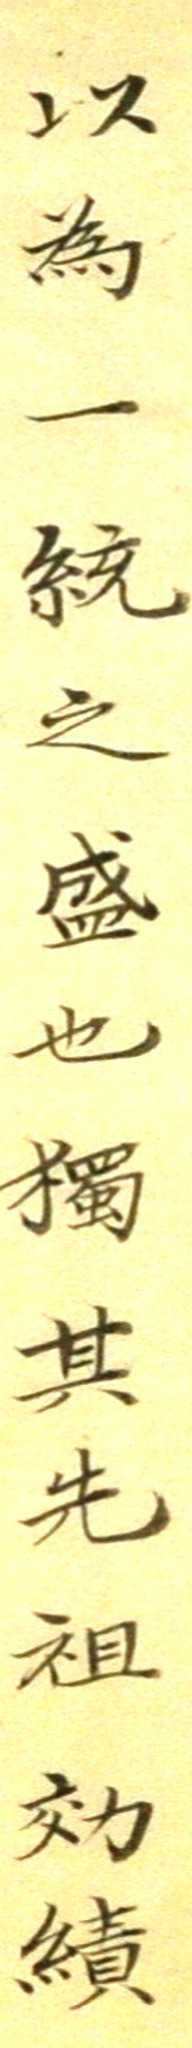以為一統之盛也独其先祖効績
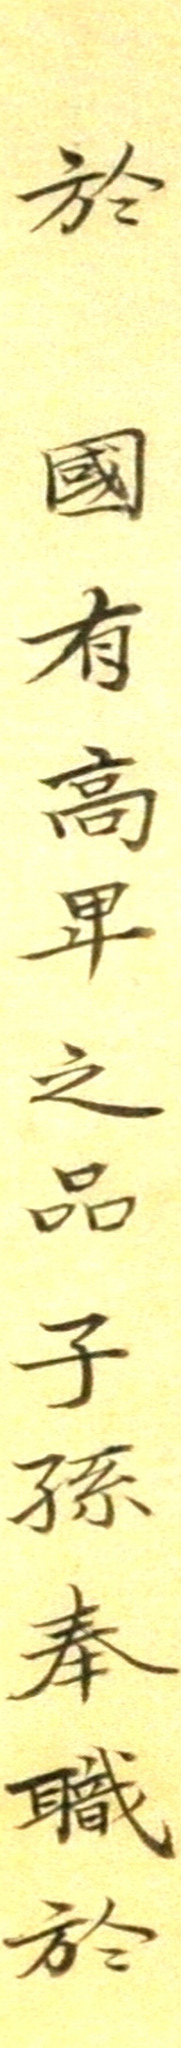於国有高卑之品子孫奉職於
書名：藩翰譜（一）
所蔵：伊那市立高遠町図書館・合同会社AMANE
